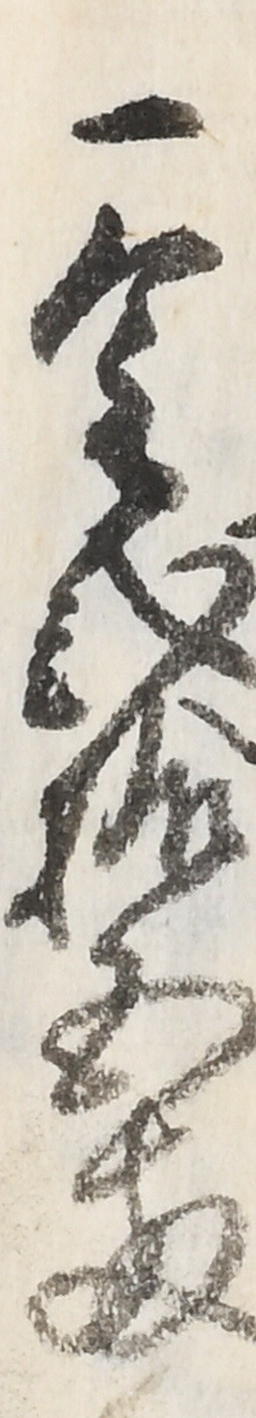一金弐拾五両
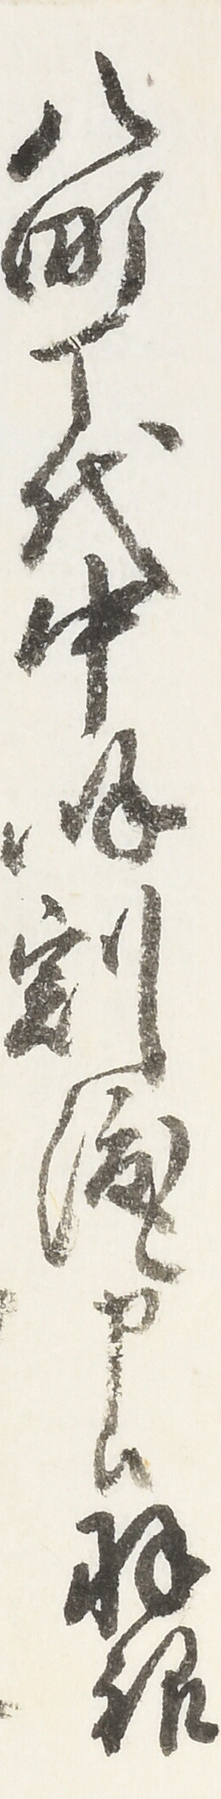八町丁代中呼割渡し申候羽根
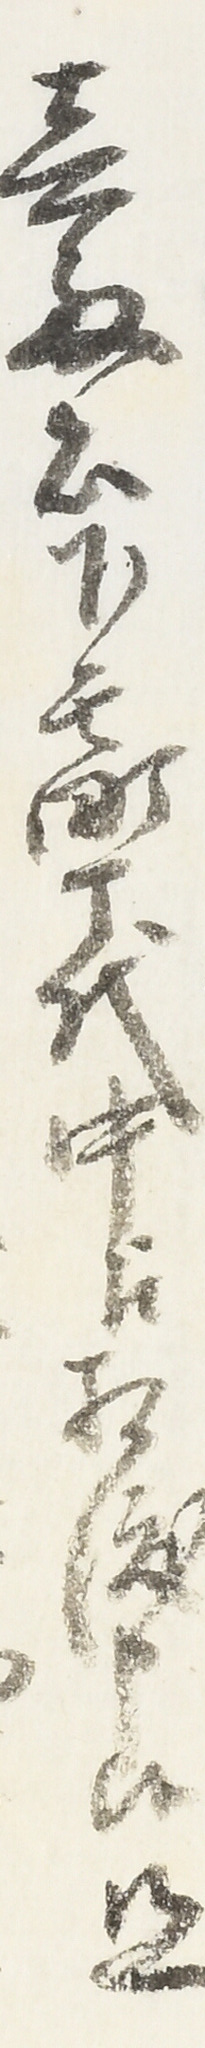壱両者下モ町丁代中江相渡申候且
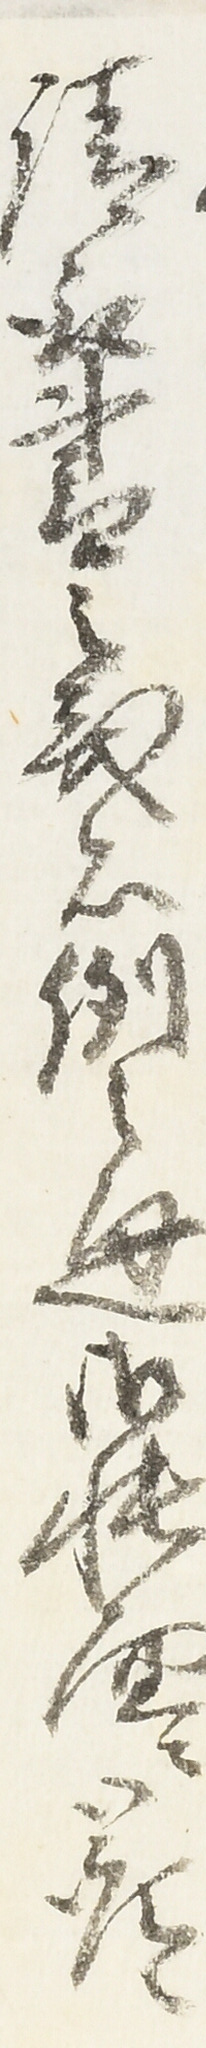請取書之義者例之通御帳面ニ被
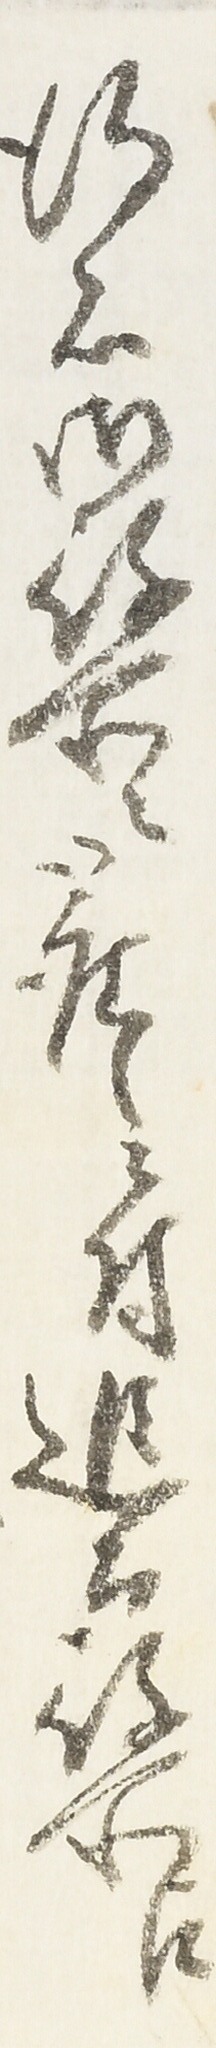行者御役所ニ御座候ニ付追而役所江
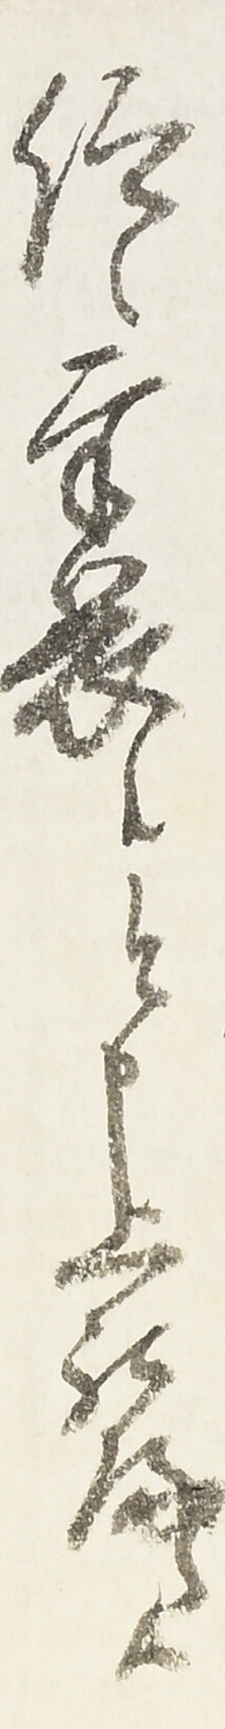仰候奉畏候と申上罷帰り候
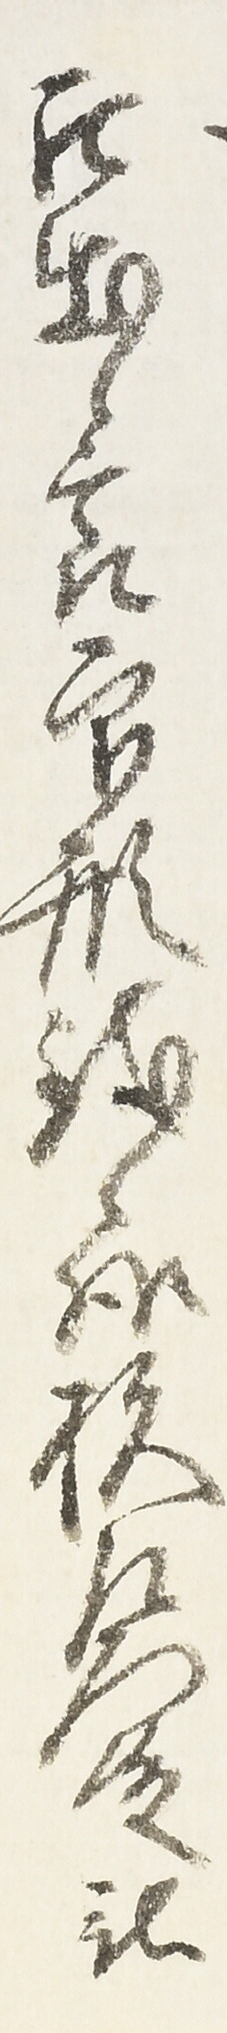罷出候節印形致候様杉左衛門殿被
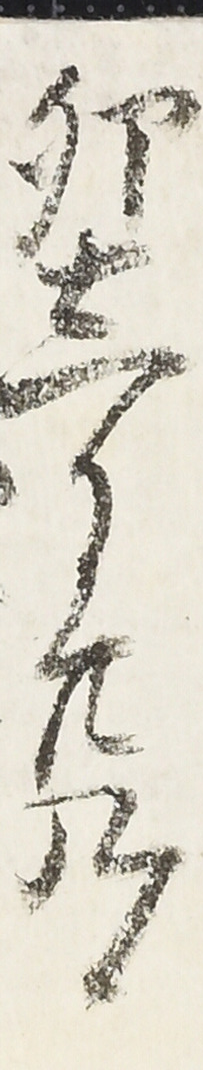卯十一月廿九日
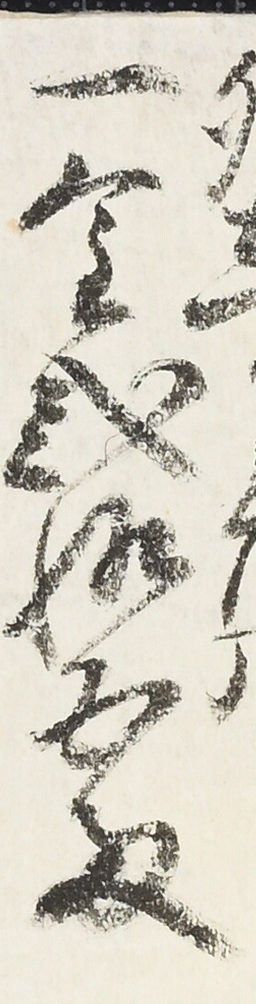一金弐拾五両
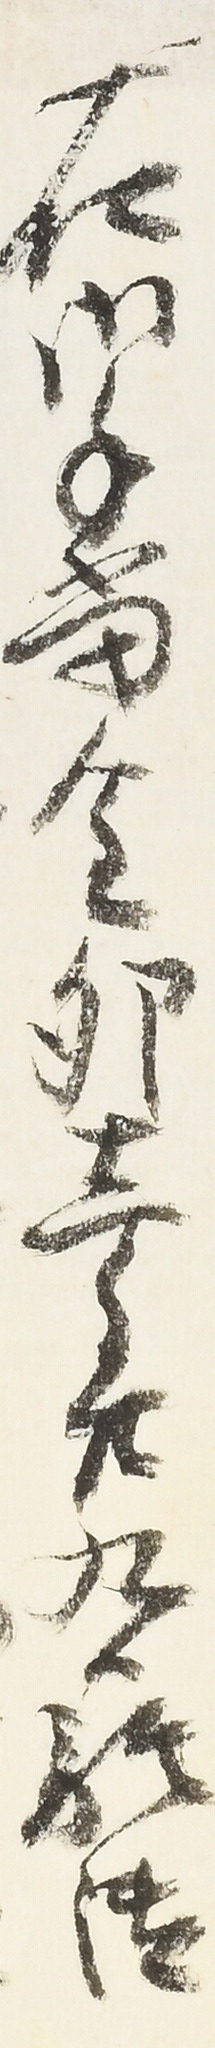右御手当金卯十一月廿九日於請
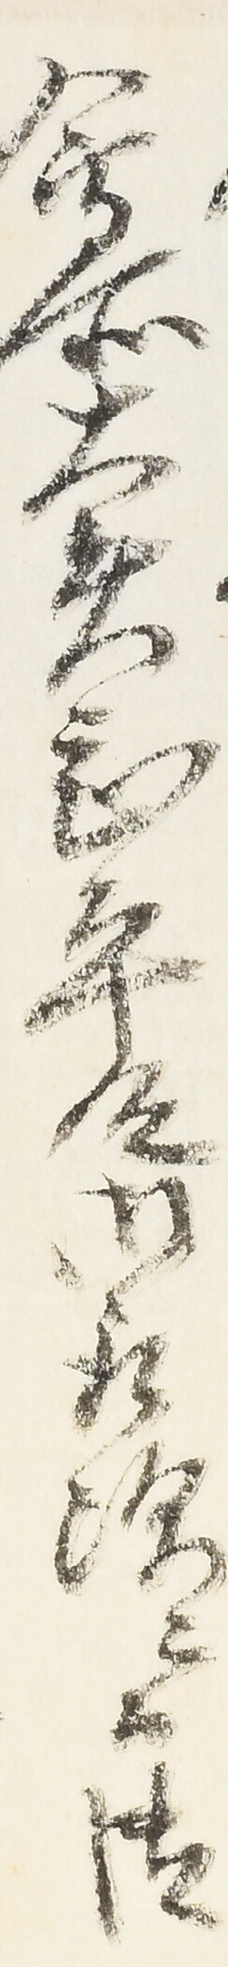会所大倉正平殿御取次ニ而請
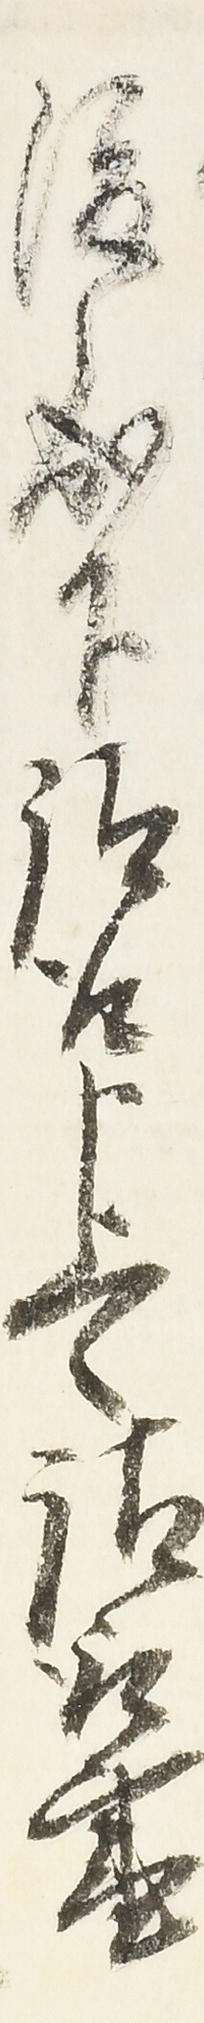渡し成下請取申上候ハバ請取置
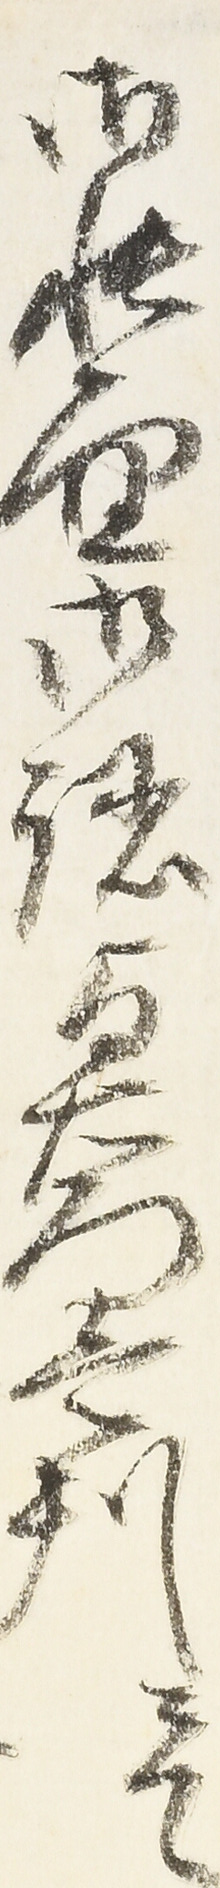御帳面御認与右衛門壱判ニて
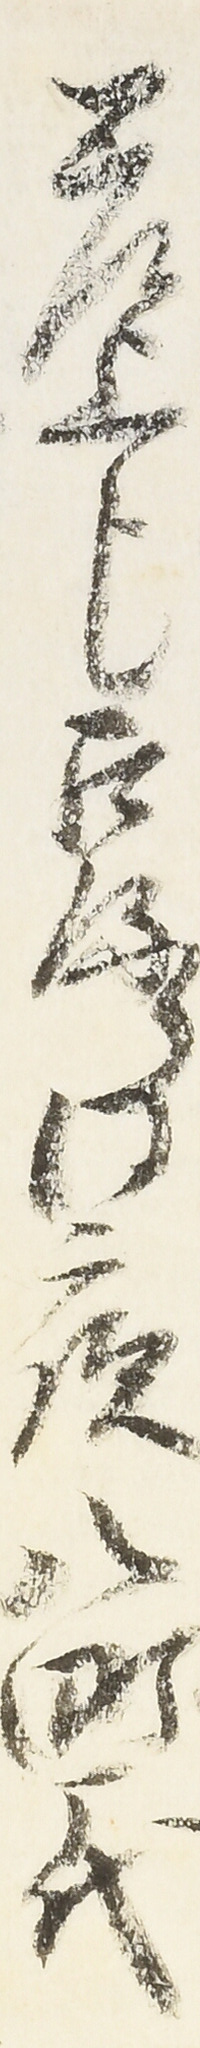差上申し罷帰り同夜八町丁代
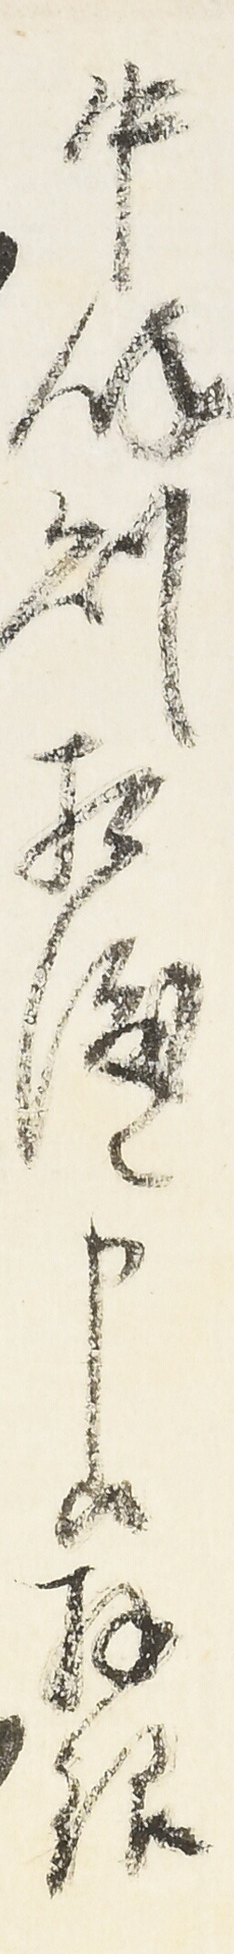中即刻相渡し申候羽根
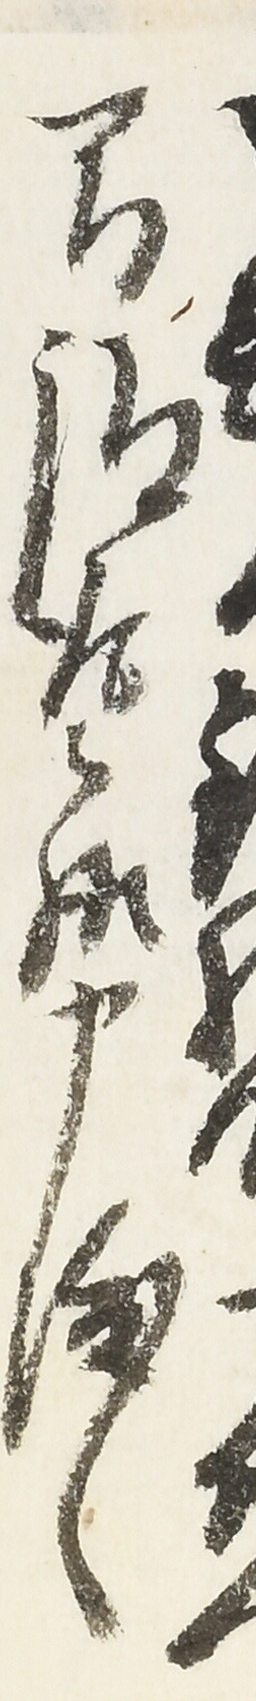間請取候様申渡候
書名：御才覚金御利足割渡扣帳
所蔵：伊那市立高遠町図書館・合同会社AMANE
